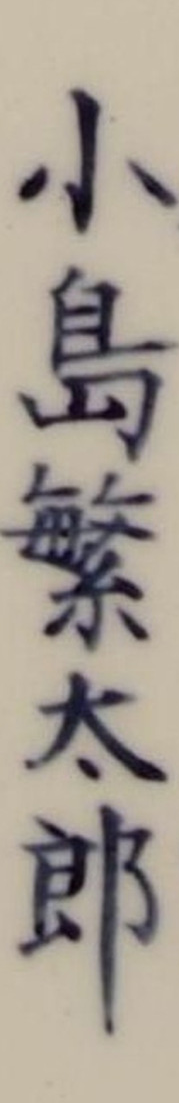小島繁太郎
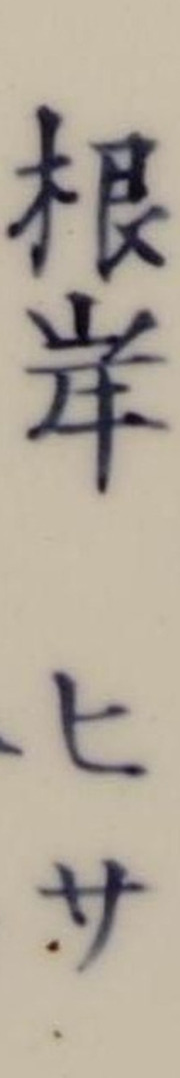根岸ヒサ
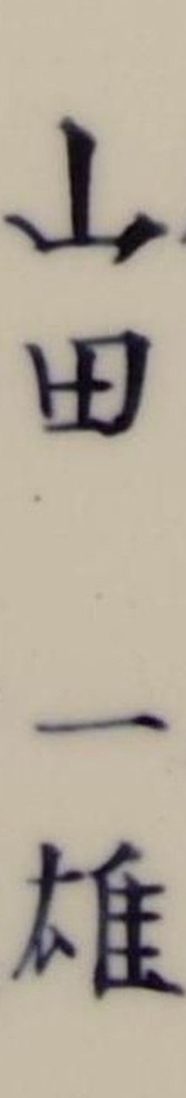山田一雄
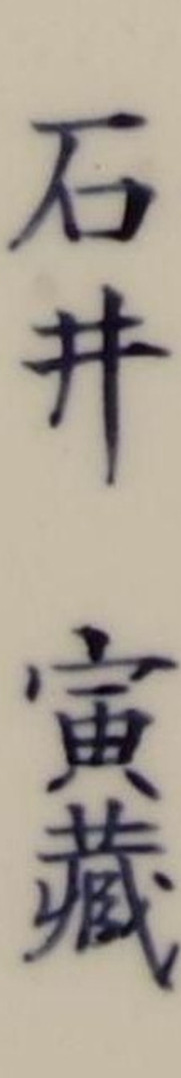石井寅蔵

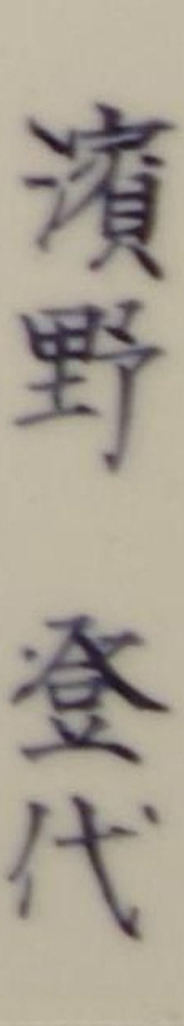濱野登代
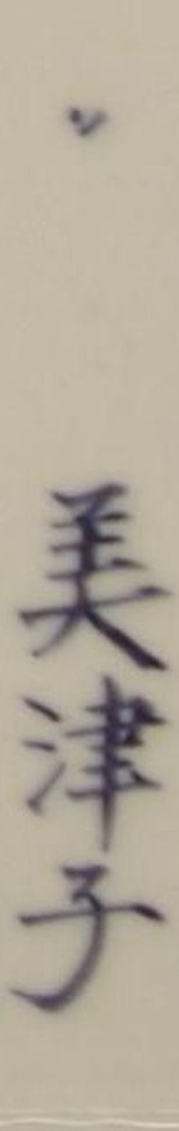美津子
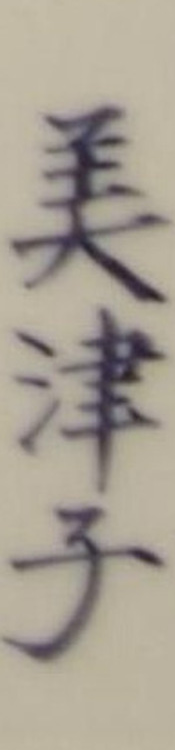美津子
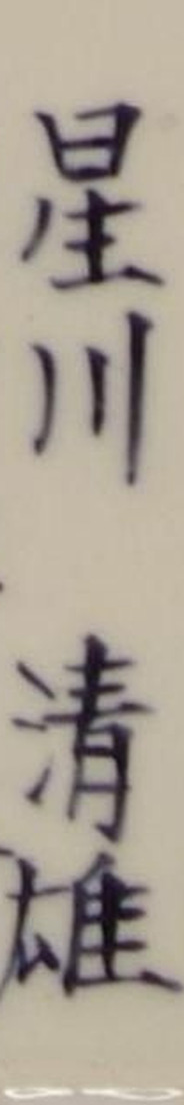星川清雄
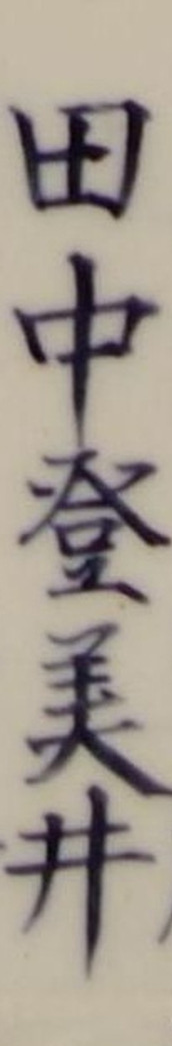田中登美井
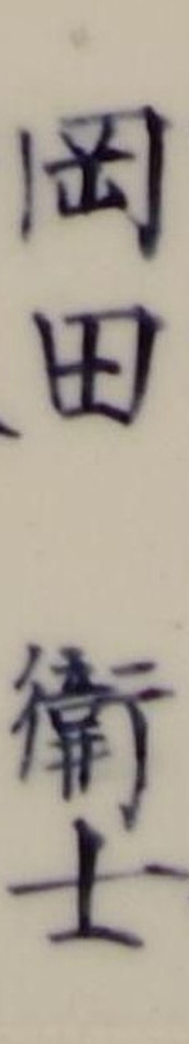岡田衛士
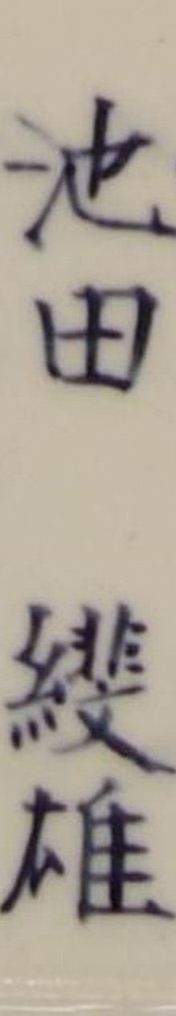池田綾雄
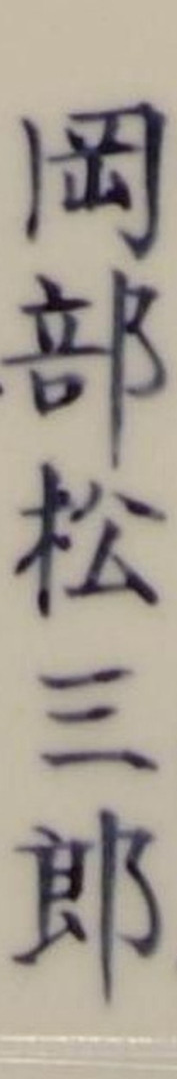岡部松三郎
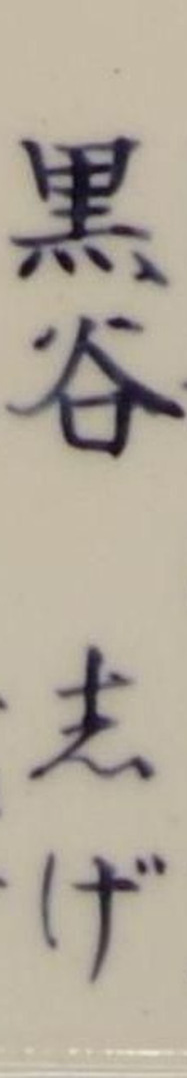黒谷しげ
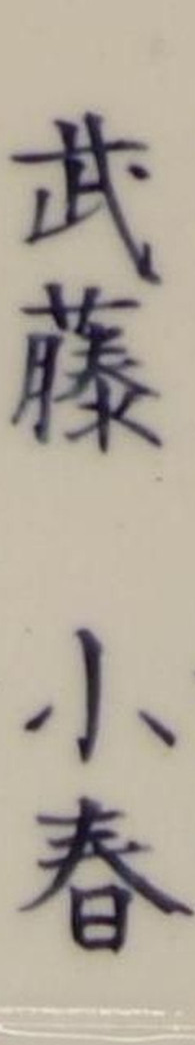武藤小春
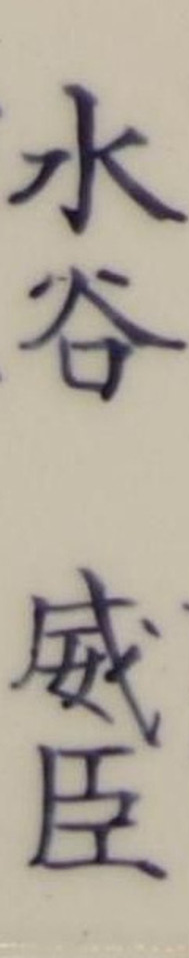水谷威臣
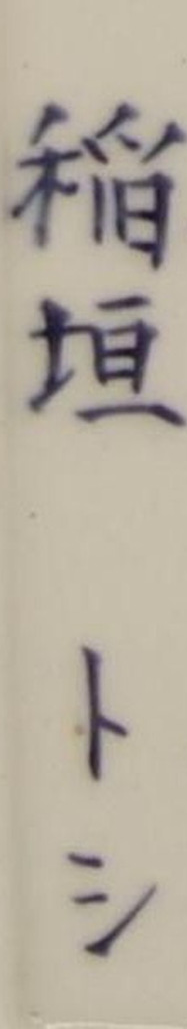稲垣トシ
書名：M~S
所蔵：高野山金剛峯寺
